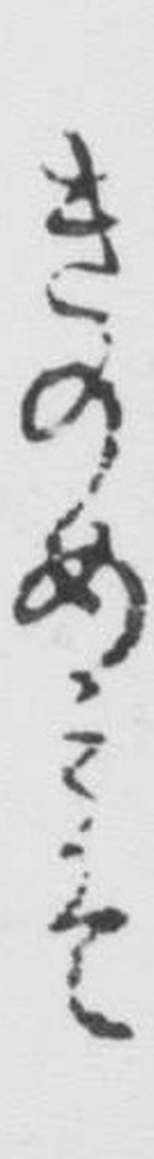きのめみそ
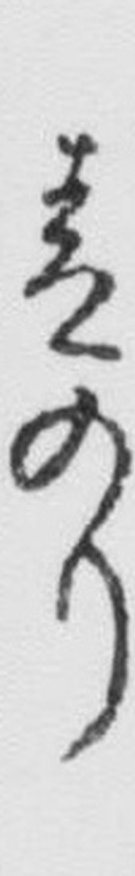青のり

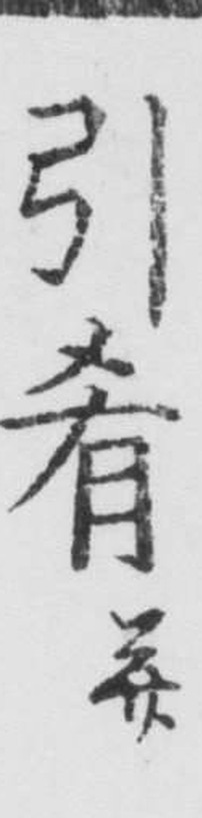引魚并
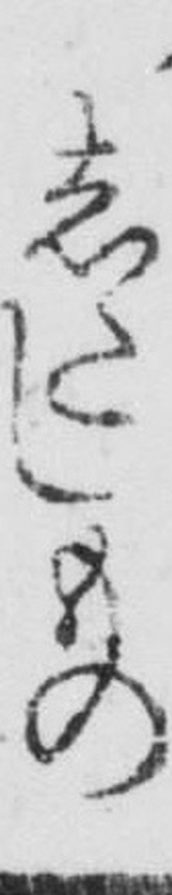したしもの
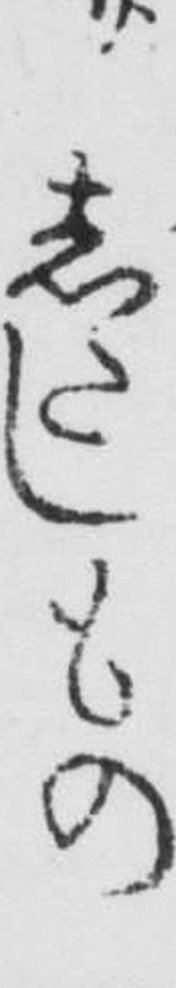したしもの
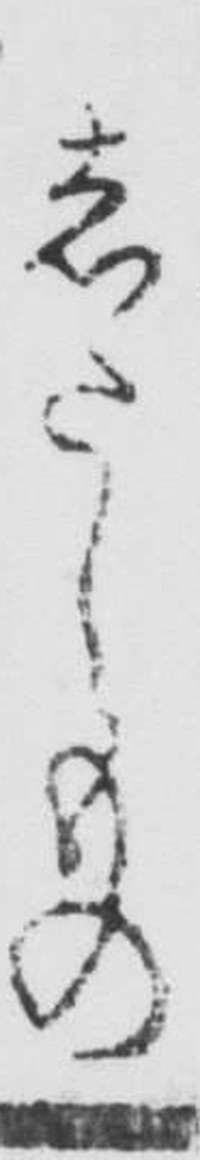したしもの
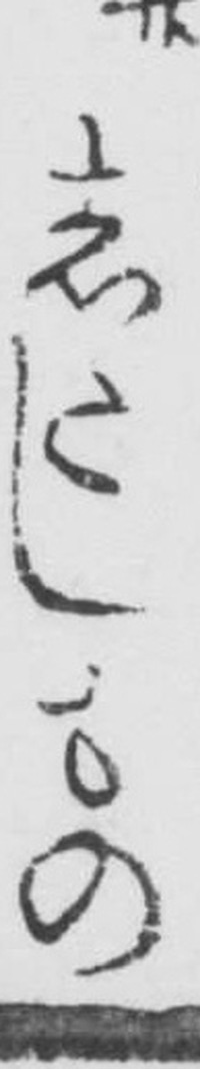したしもの
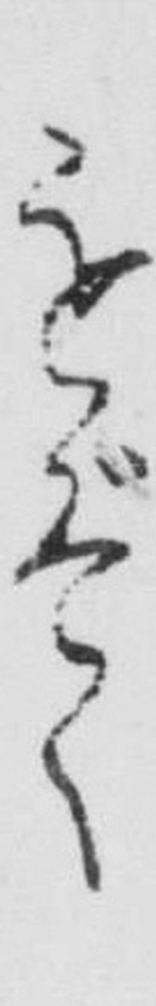もぞく
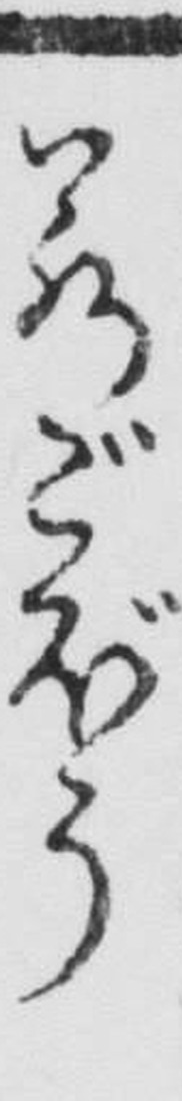若ごぼう
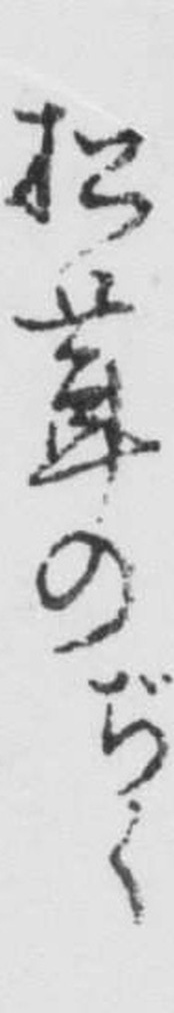松茸のぢく
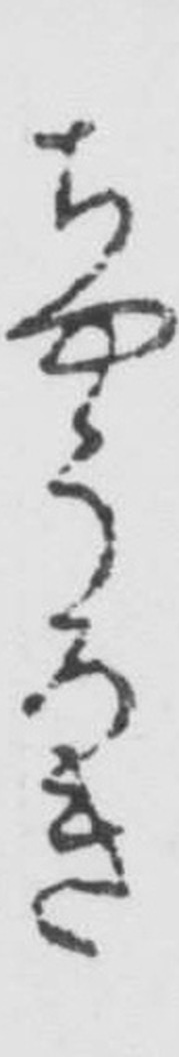ちやうろき
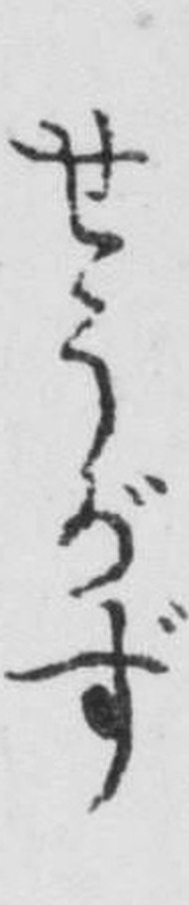せうがず
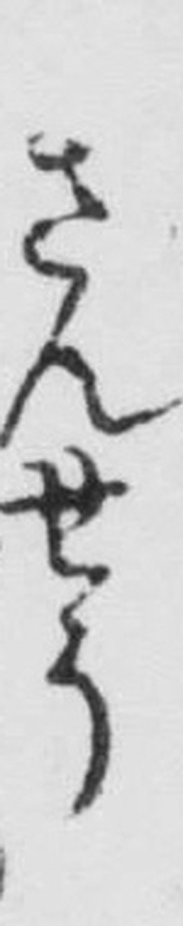さんせう
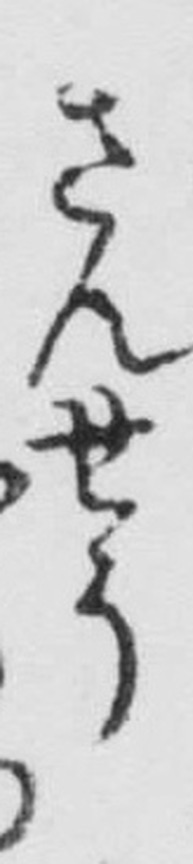さんせう
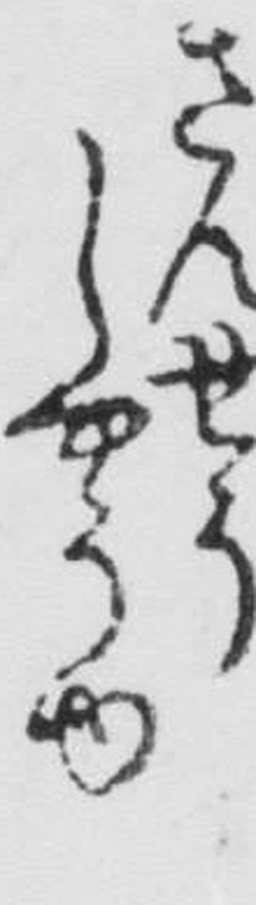しやうゆ
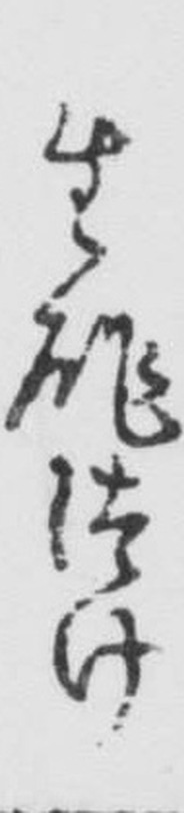生酢つけ
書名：諸家通用/即席料理
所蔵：大阪府立大学学術情報センター 国文学研究資料館
